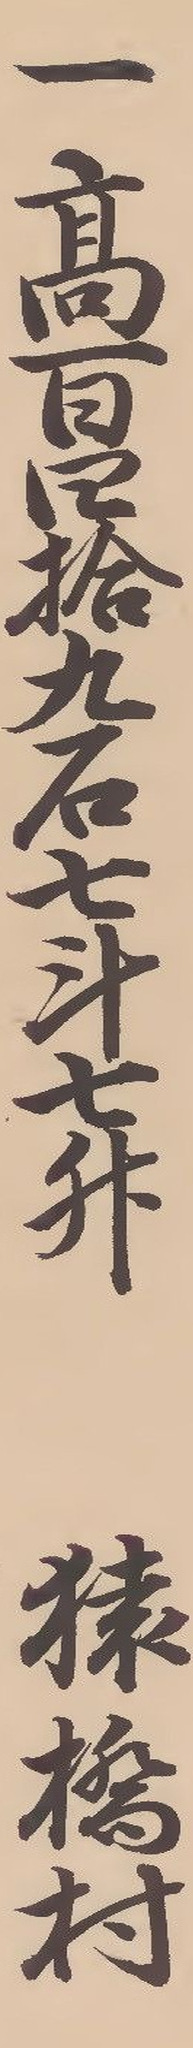一高百四拾九石七斗七升猿橋村

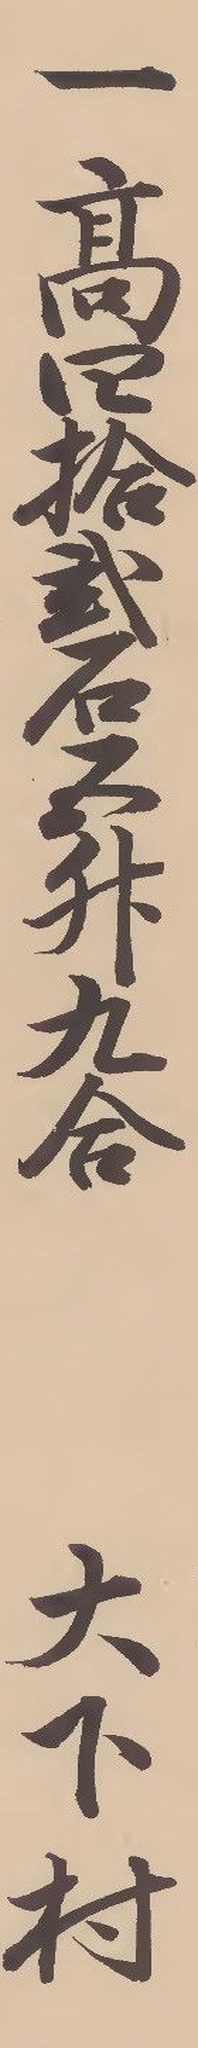一高四拾弐石五升九合大下村
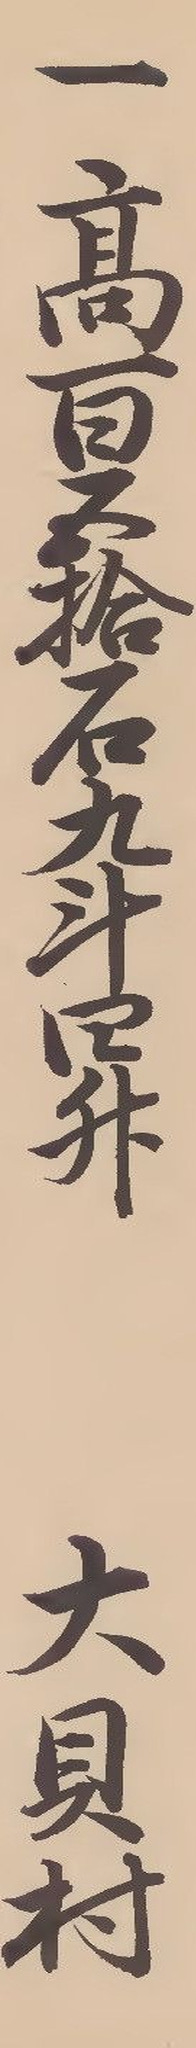一高百五拾石九斗四升大貝村
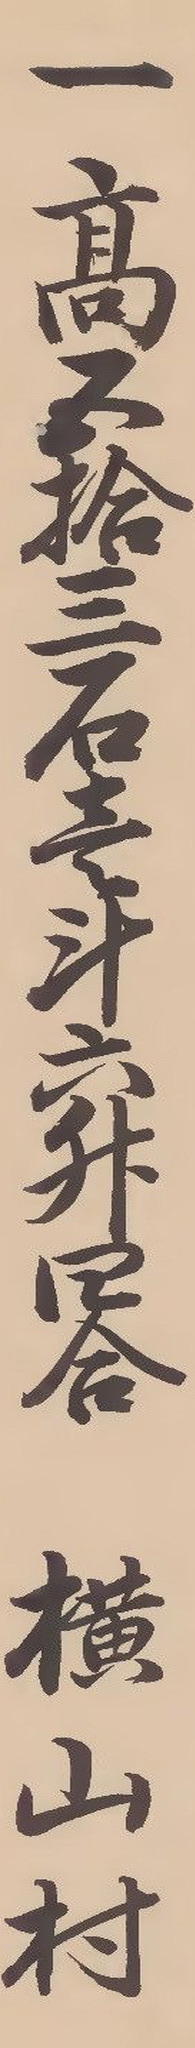一高五拾三石壱斗六升四合横山村
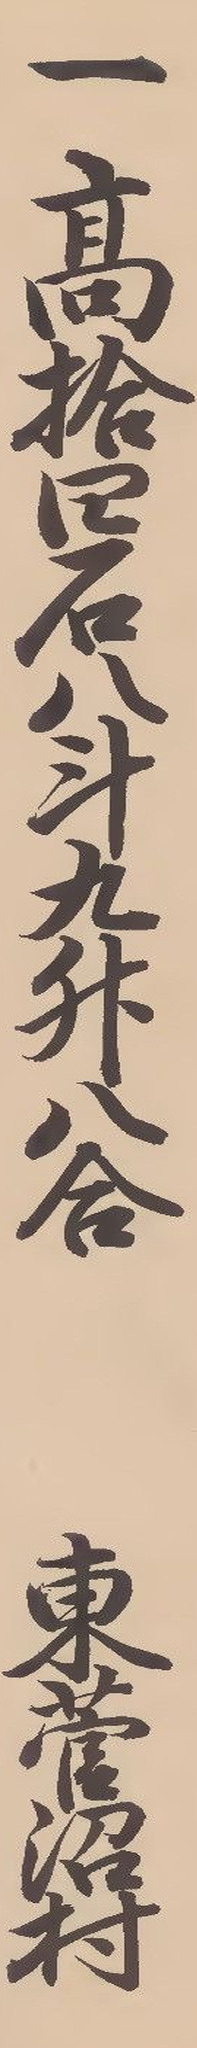一高拾四石八斗九升八合東菅沼村
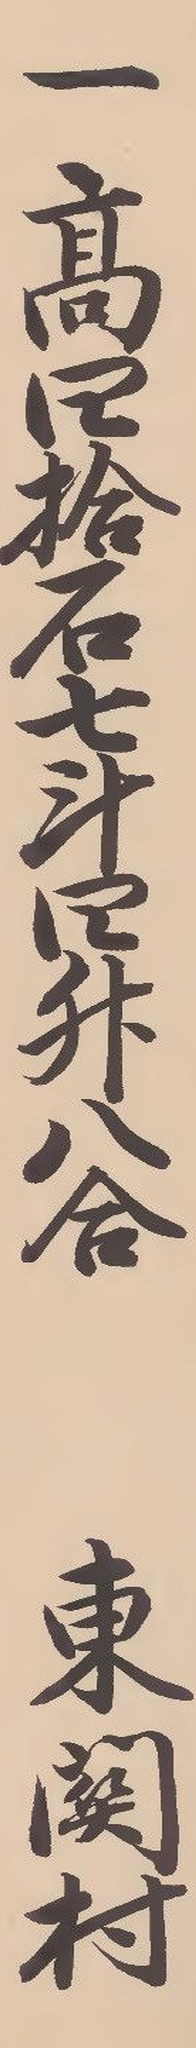一高四拾石七斗四升八合東関村
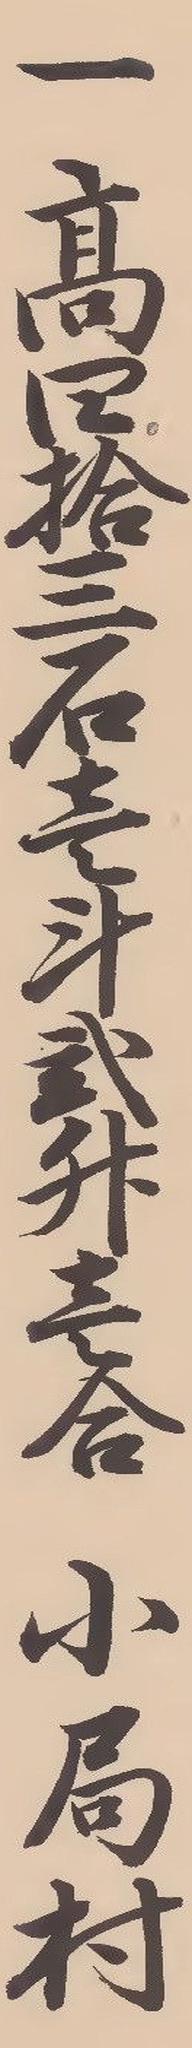一高四拾三石壱斗弐升壱合小局村
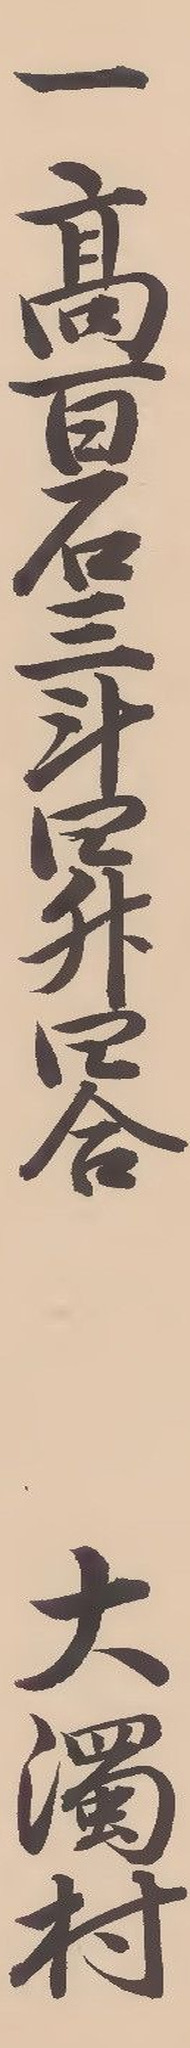一高百石三斗四升四合大濁村
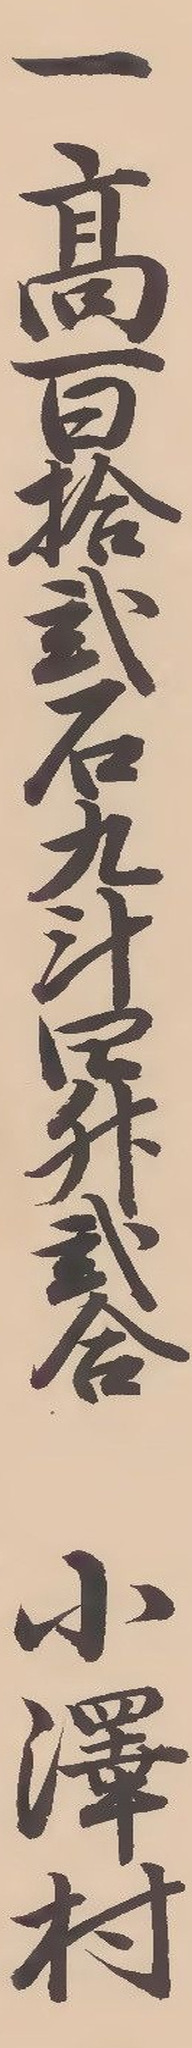一高百拾弐石九斗四升弐合小沢村

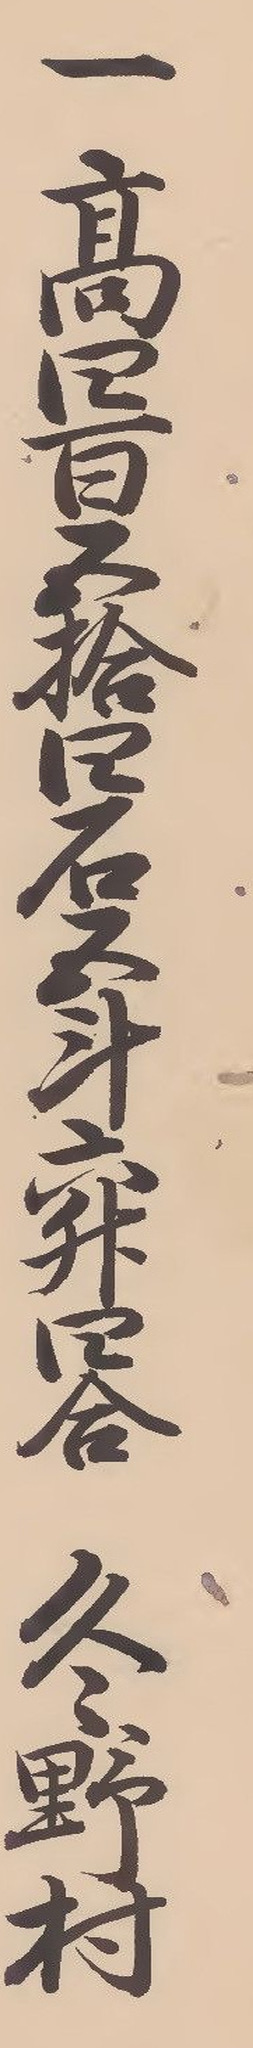一高四百五拾四石五斗六升四合久々野村
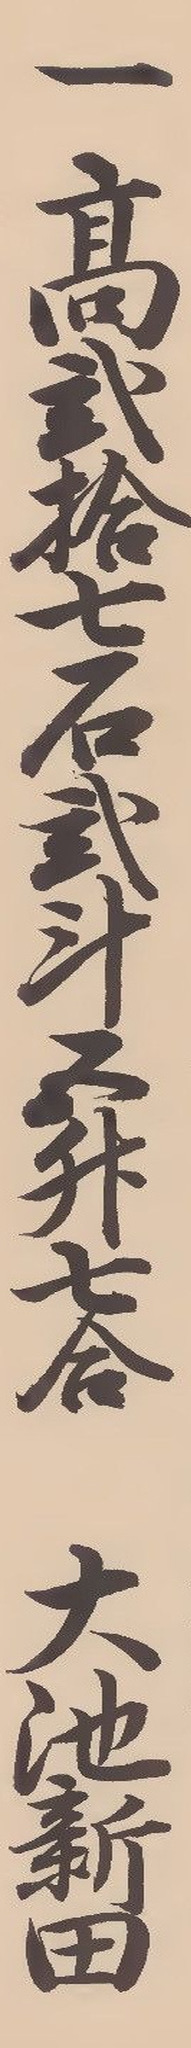一高弐拾七石弐斗五升七合大池新田
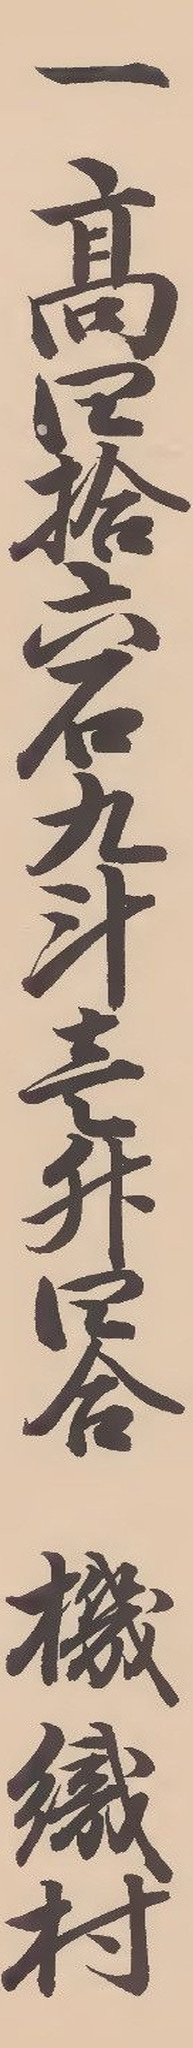一高四拾六石九斗壱升四合機織村
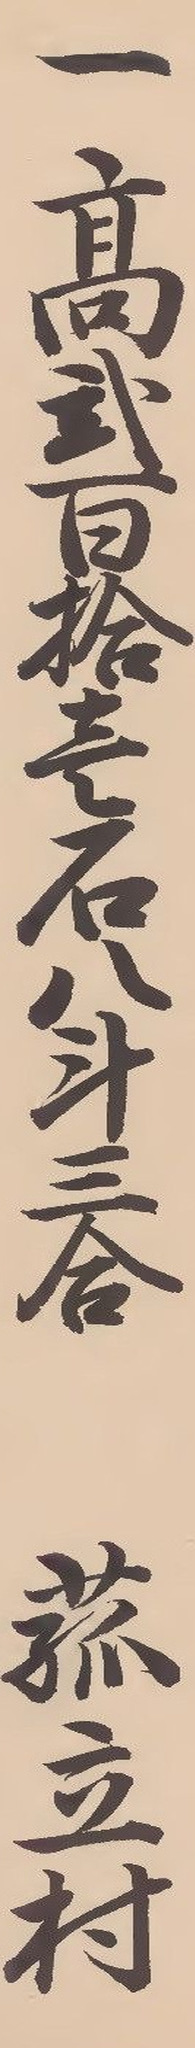一高弐百拾壱石八斗三合菰立村
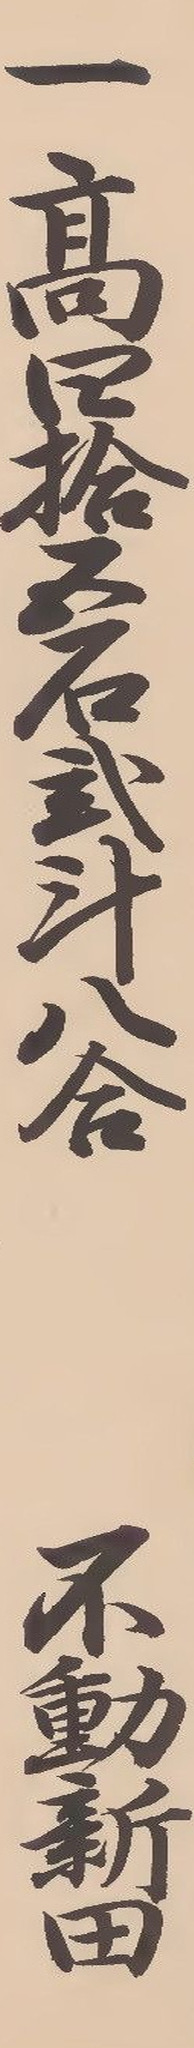一高四拾五石弐斗八合不動新田
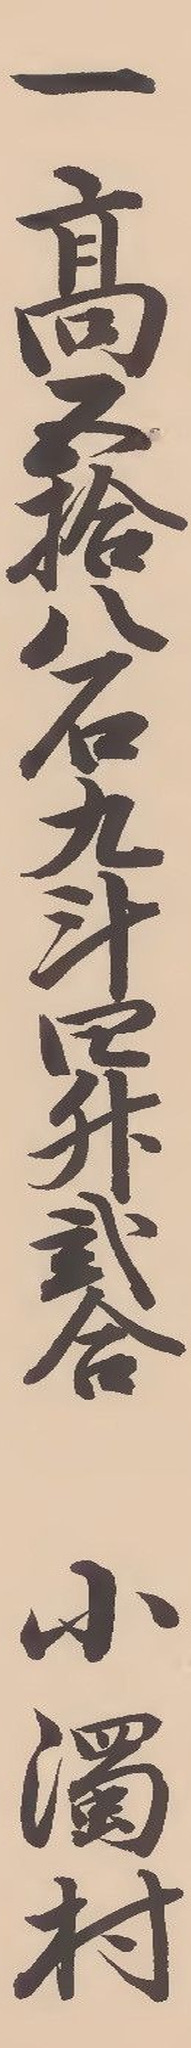一高五拾八石九斗四升弐合小濁村
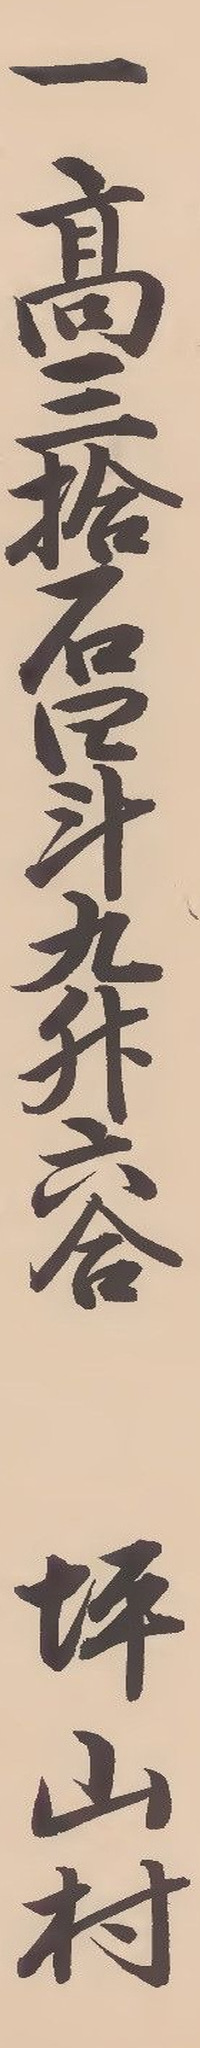一高三拾石四斗九升六合坪山村
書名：越後国郷帳　上
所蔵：国立公文書館 National Archives of Japan
